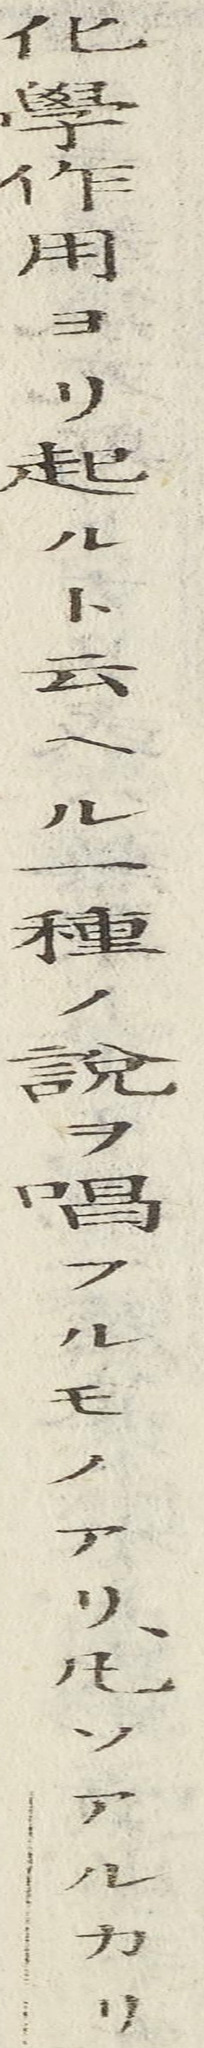化学作用ヨリ起ルト云ヘル一種ノ説ヲ唱フルモノアリ、凡ソアルカリ
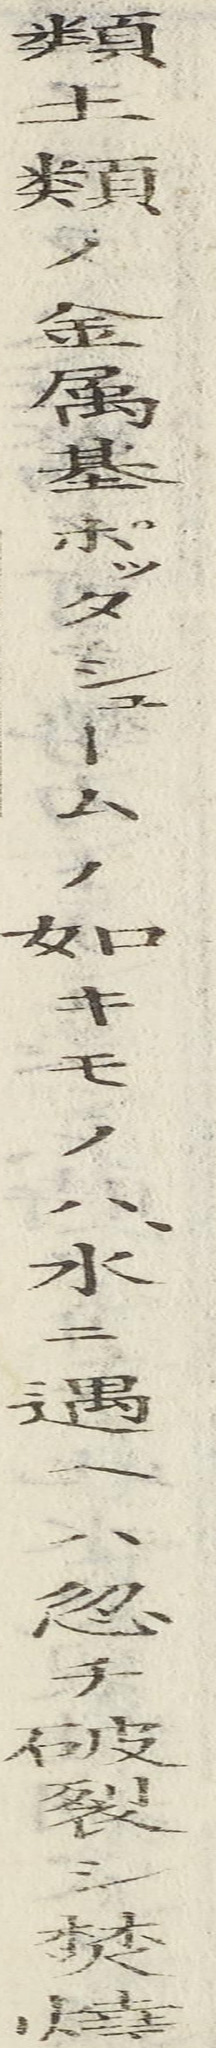類土類ノ金属基ポッタシュームノ如キモノハ、水ニ遇ヘハ忽チ破裂シ焚焼
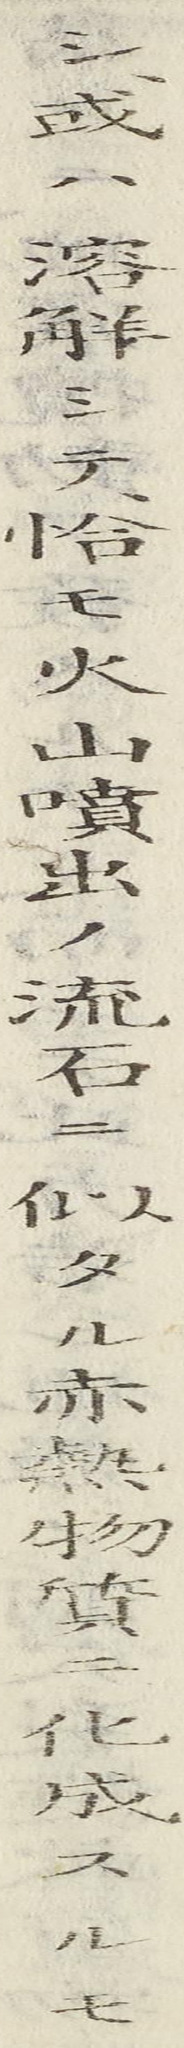シ、或ハ溶解シテ、恰モ火山噴出ノ流石ニ似タル赤熱物質ニ化成スルモ
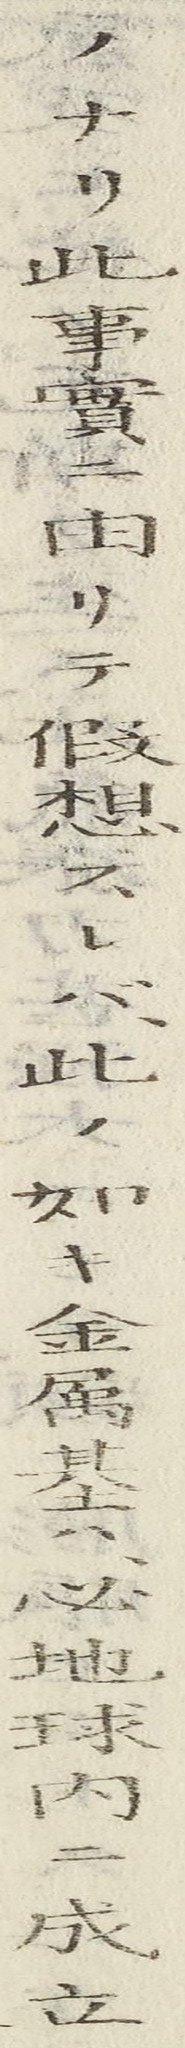ノナリ此事実ニ由リテ仮想スレバ、此ノ如キ金属基ハ、必地球内ニ成立
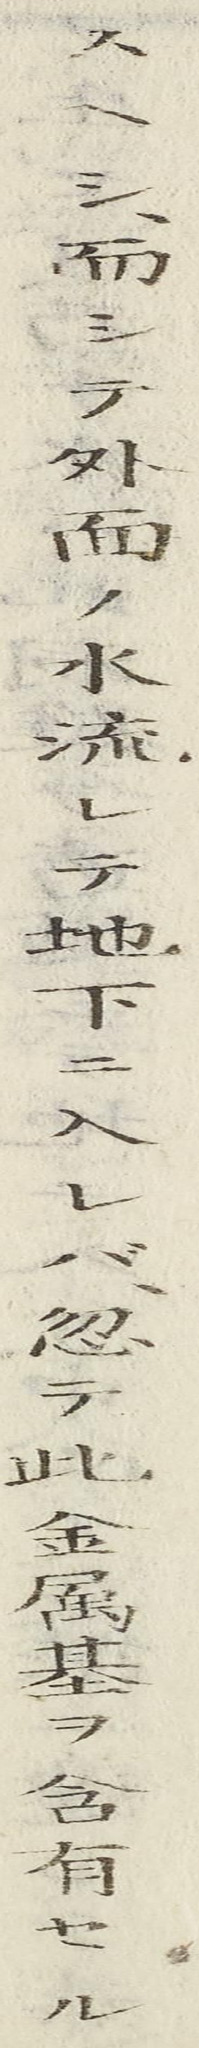スヘシ、而シテ外面ノ水流レテ地下ニ入レバ、忽チ此金属基ヲ含有セル
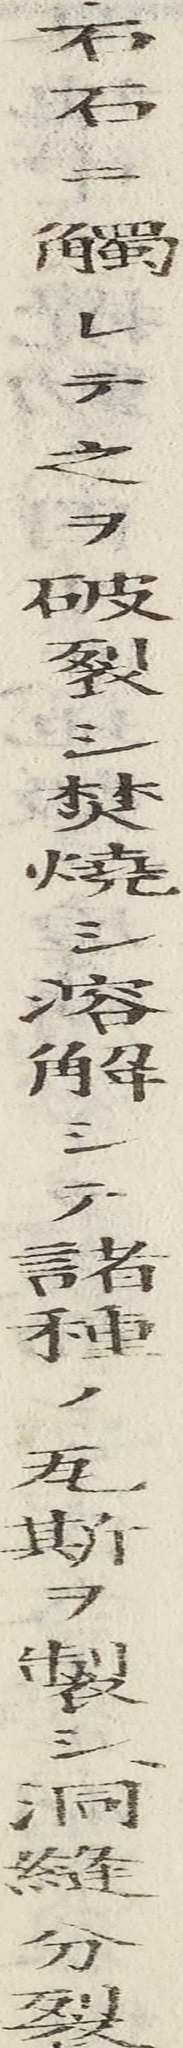岩石ニ触レテ之ヲ破裂シ焚焼シ溶解シテ諸種ノ瓦斯ヲ製シ、洞縫分裂
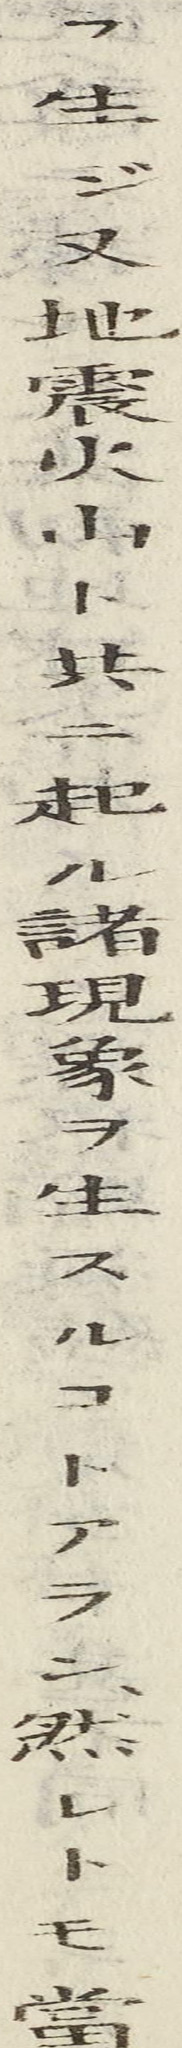ヲ生ジ又地震火山ト共ニ起ル諸現象ヲ生スルコトアラン、然レトモ当
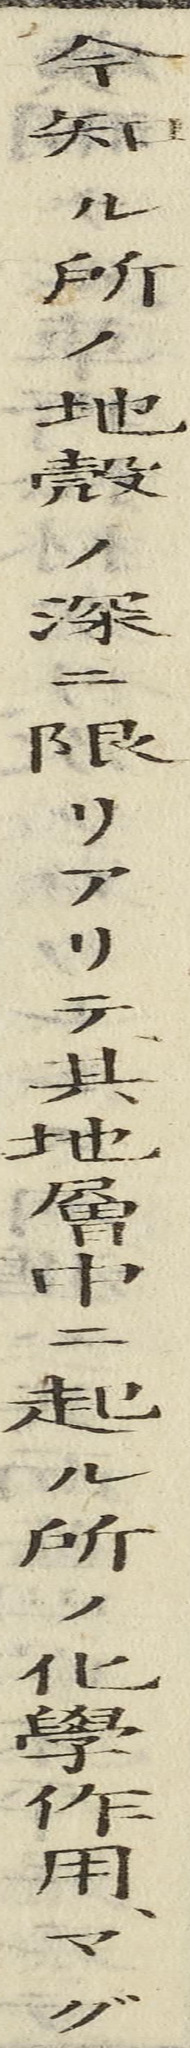今知ル所ノ地殻ノ深ニ限リアリテ、其地層中ニ起ル所ノ化学作用、マグ
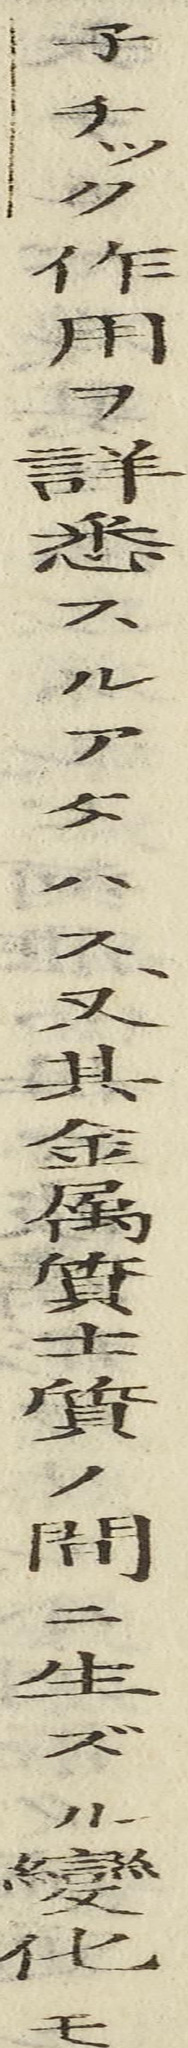ネチック作用ヲ詳悉スルアタハス、又其金属質土質ノ間ニ生ズル変化モ
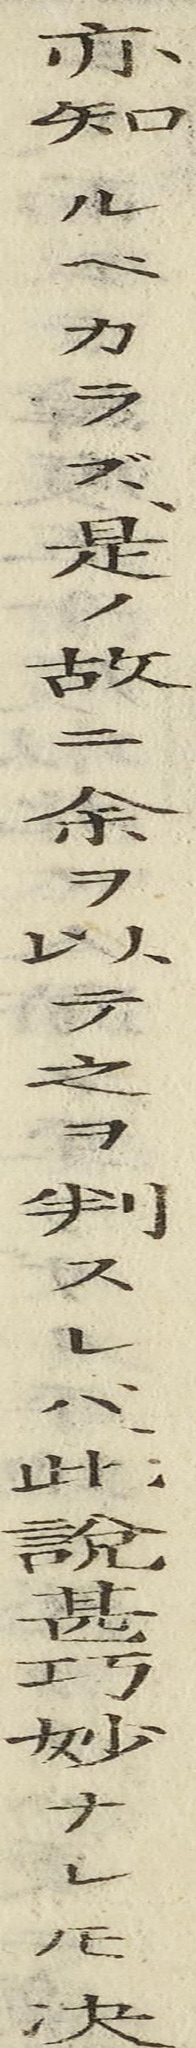亦知ルベカラズ、是ノ故ニ余ヲ以テ之ヲ判スレバ、此説甚巧妙ナレトモ決
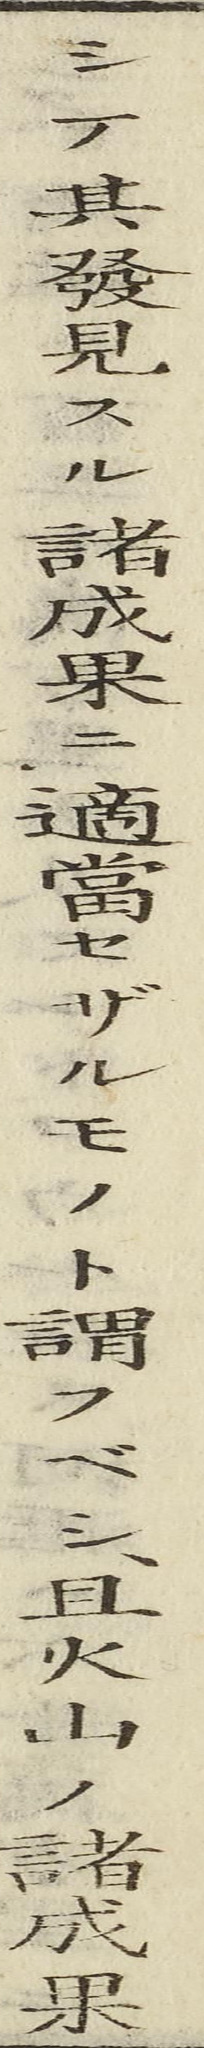シテ其発見スル諸成果ニ適当セザルモノト謂フベシ、且火山ノ諸成果
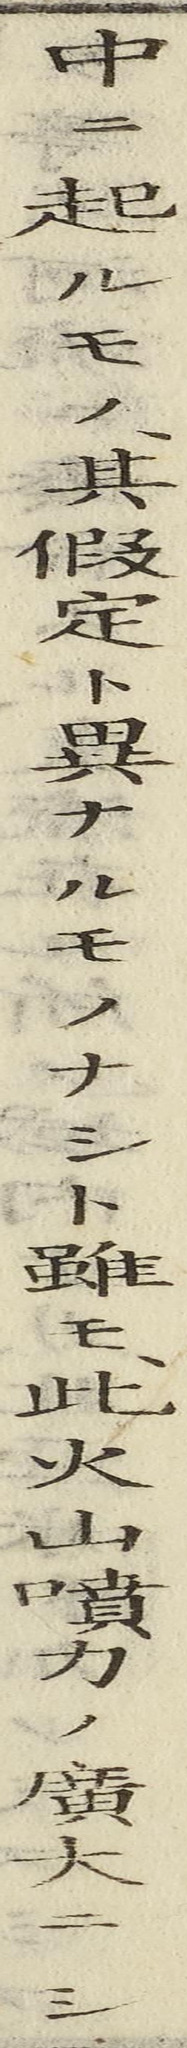中ニ起ルモノ、其仮定ト異ナルモノナシト雖モ、此火山噴力ノ広大ニシ
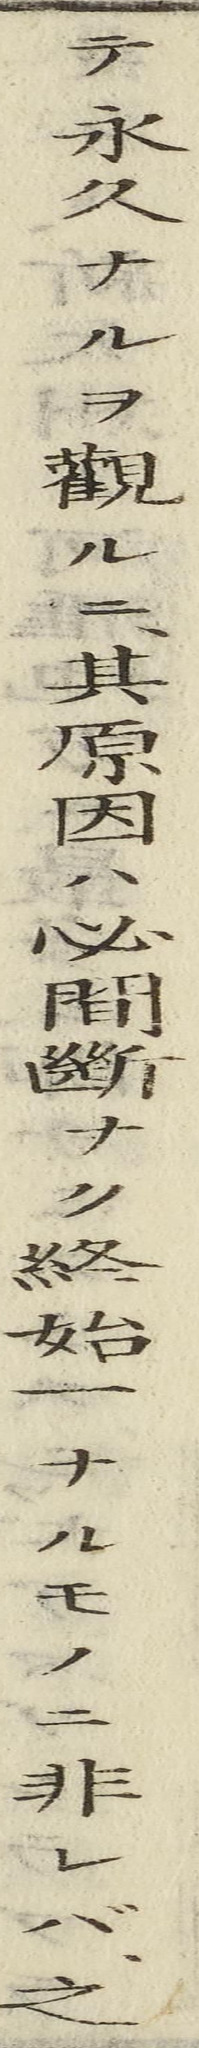テ永久ナルヲ観ルニ、其原因ハ必間断ナク終始一ナルモノニ非レバ、之
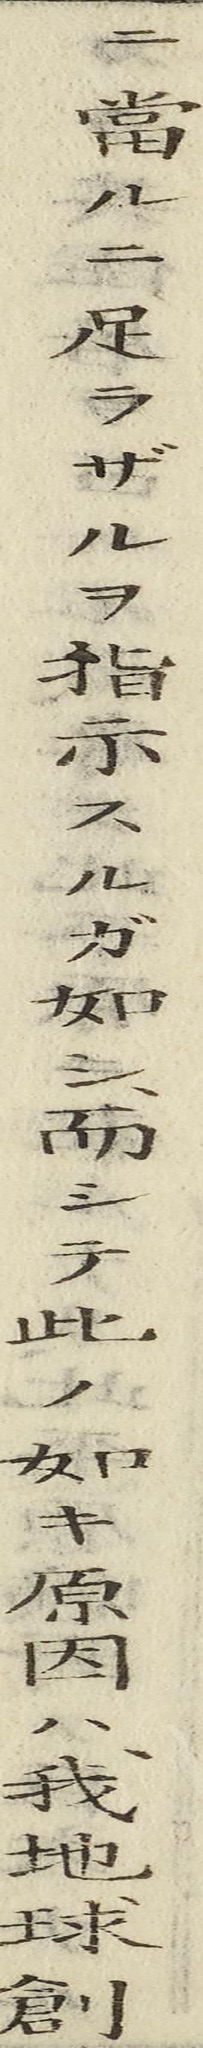ニ当ルニ足ラザルヲ指示スルガ如シ、而シテ此ノ如キ原因ハ、我地球創
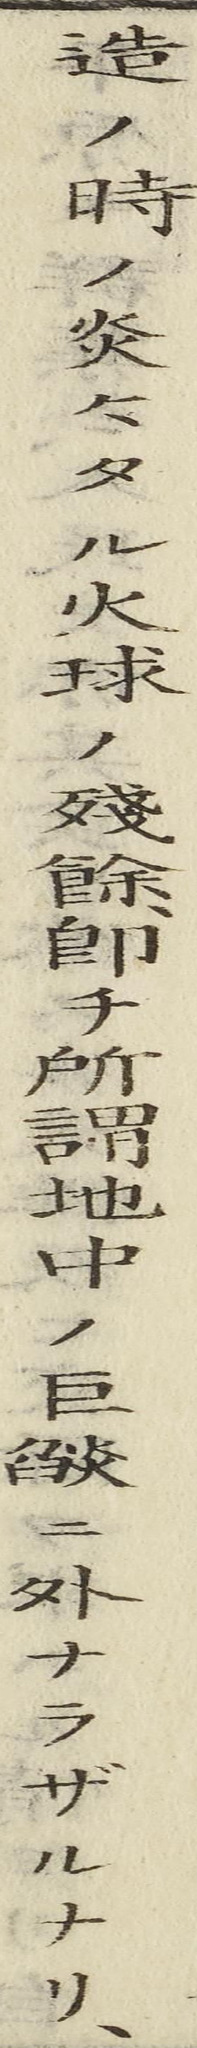造ノ時ノ炎々タル火球ノ残余、即チ所謂地中ノ巨燄ニ外ナラザルナリ、
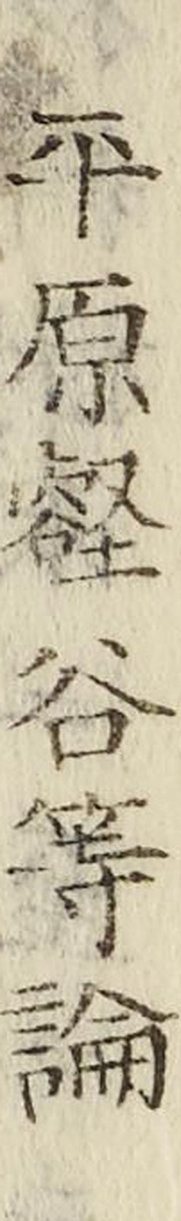平原壑谷等論
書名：百科全書　地文學　全
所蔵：東京大学地震研究所図書室 Earthquake Research Institute Library, The University of Tokyo, JAPAN
